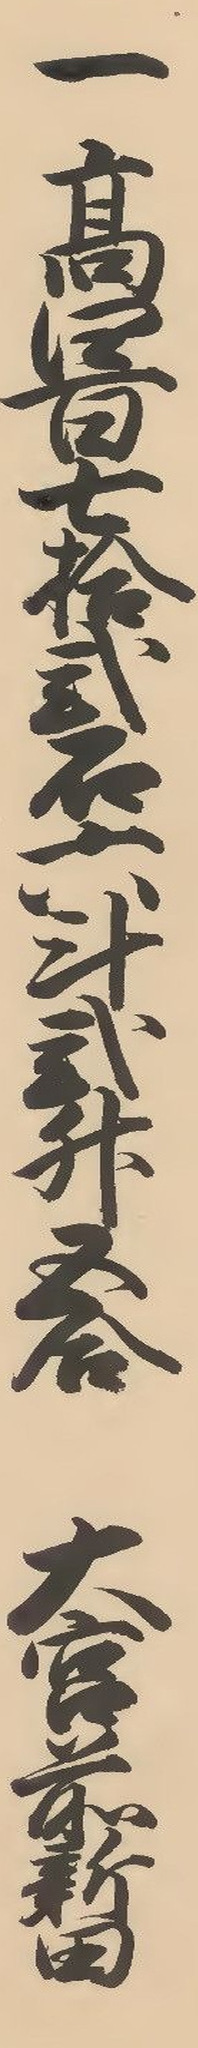一高四百七拾弐石六斗弐升五合大宮前新田
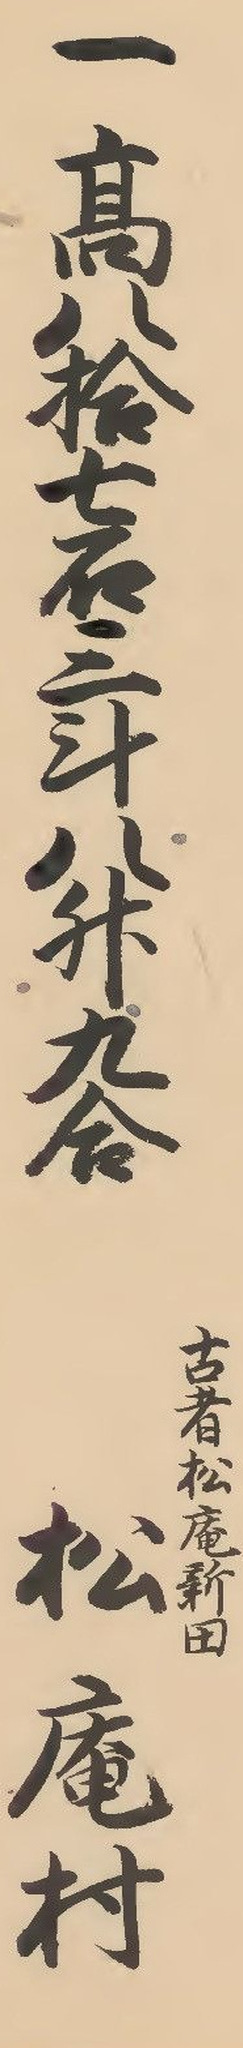一高八拾七石三斗八升九合松庵村

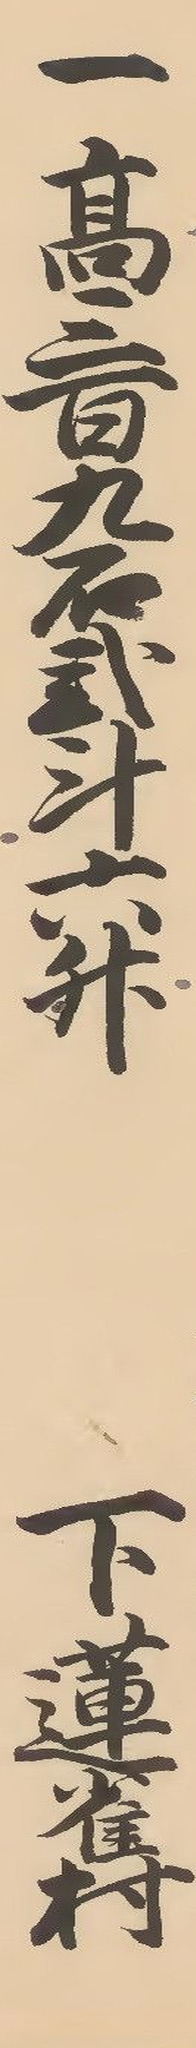一高三百九石弐斗六升下蓮雀村
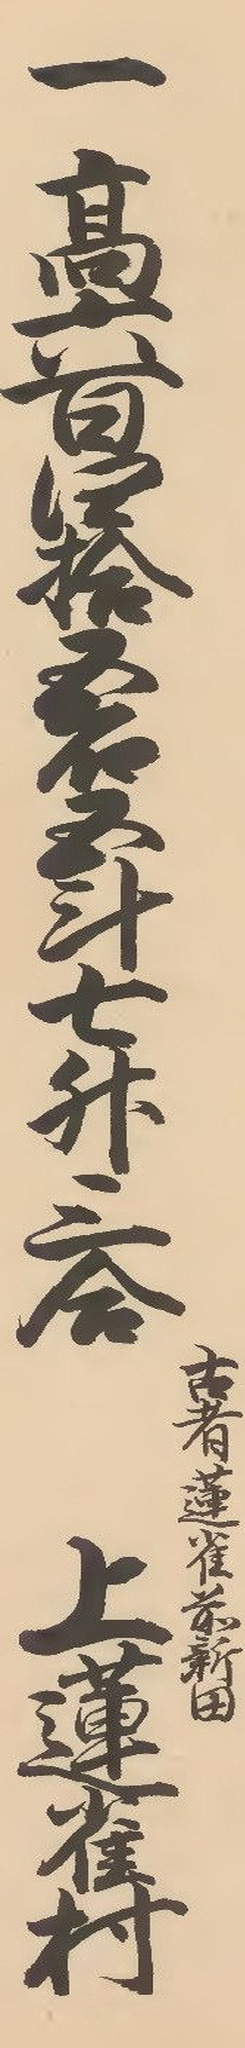一高六百四拾五石五斗七升三合上蓮雀村
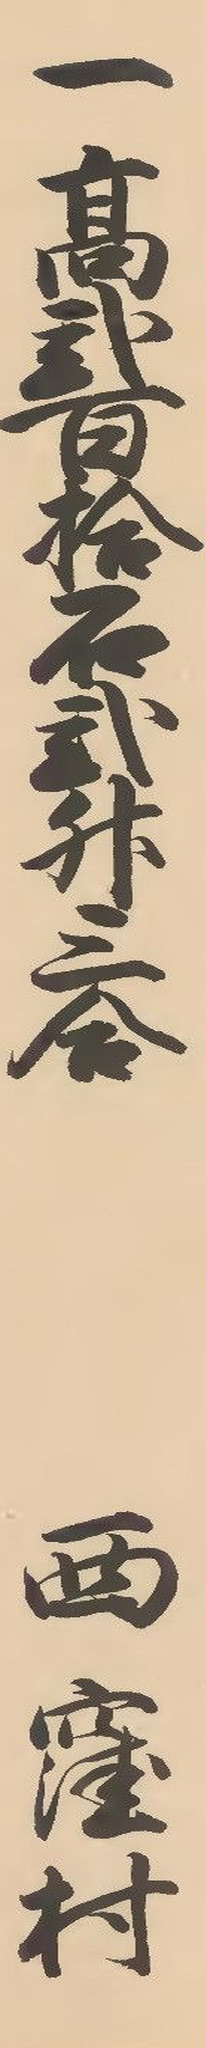一高弐百拾石弐升三合西窪村
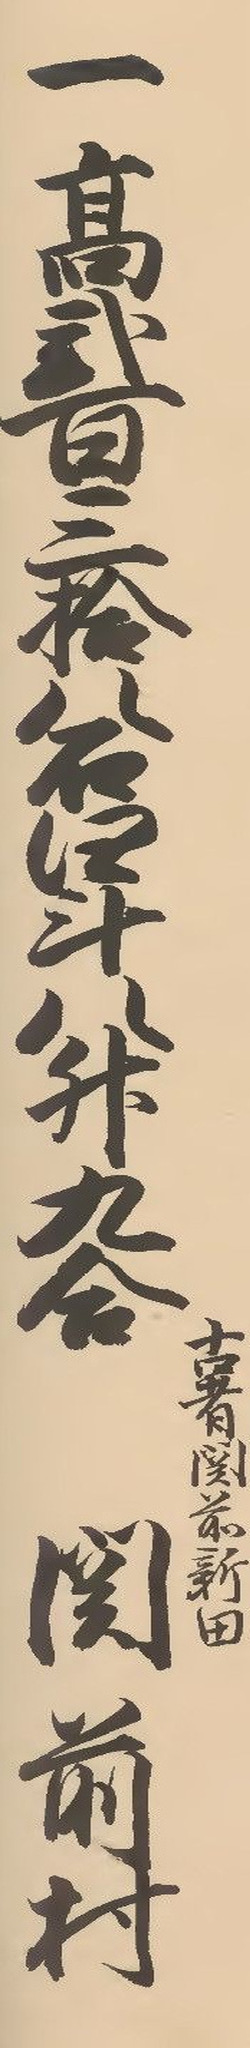一高弐百三拾八石四斗八升九合関前村
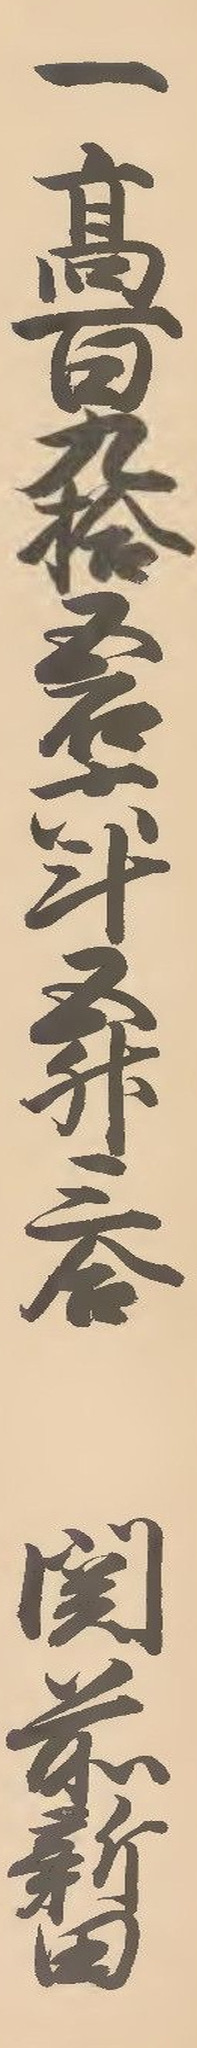一高百九拾五石六斗五升三合関前新田
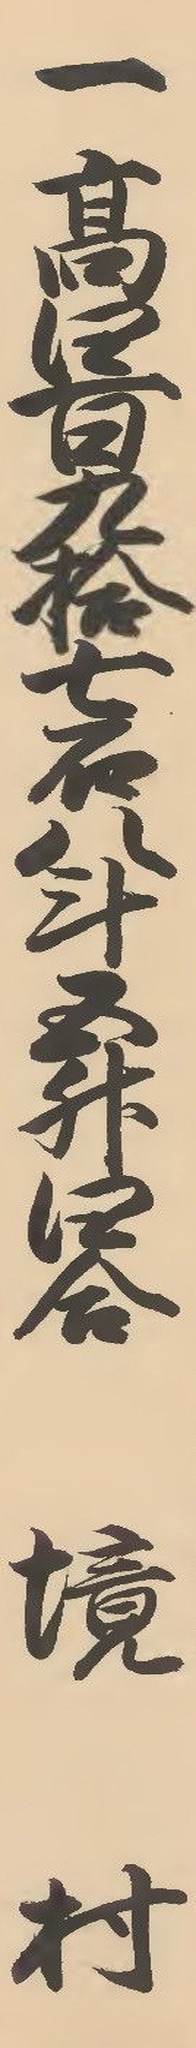一高四百九拾七石八斗五升四合境村
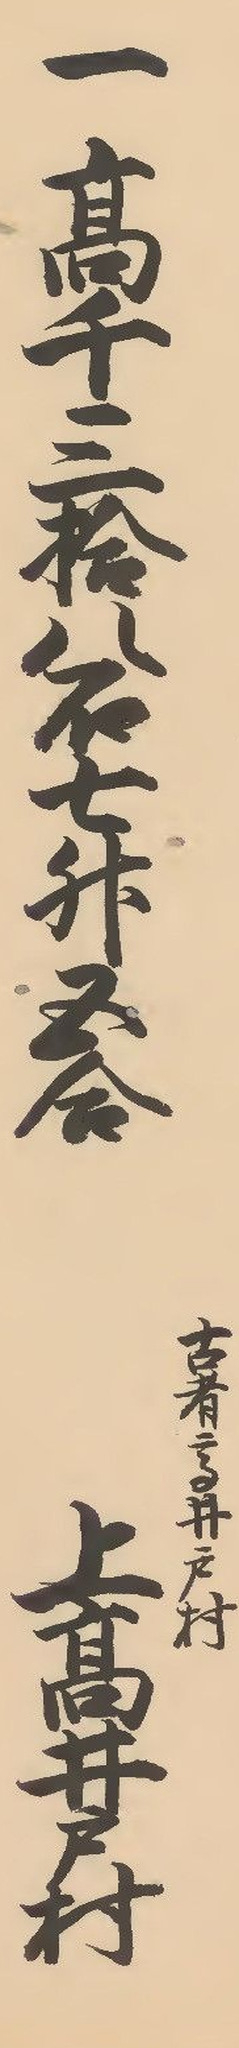一高千三拾八石七升五合上高井戸村

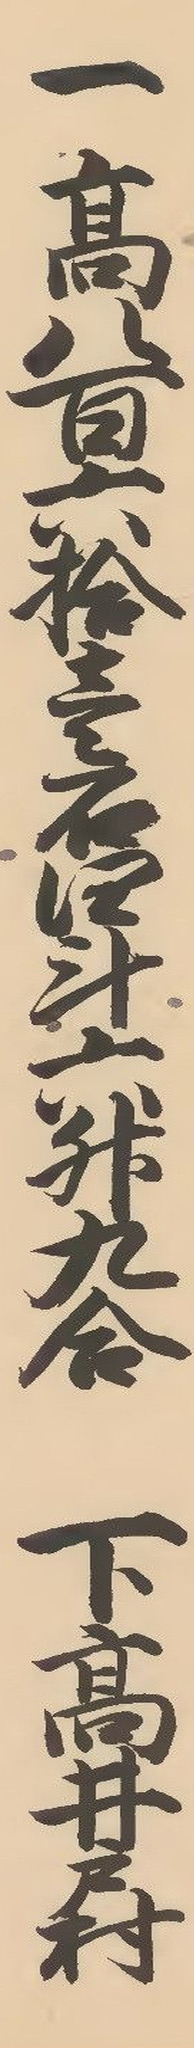一高八百六拾壱石四斗六升九合下高井村
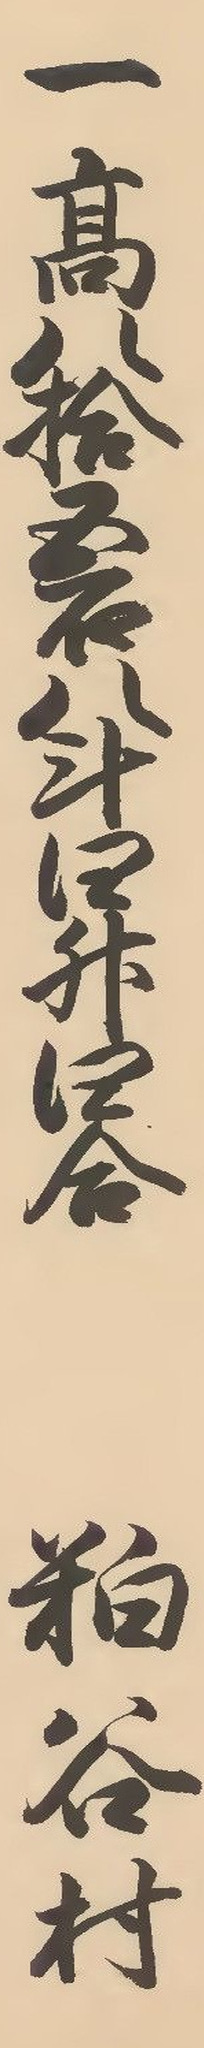一高八拾五石八斗四升四合粕谷村
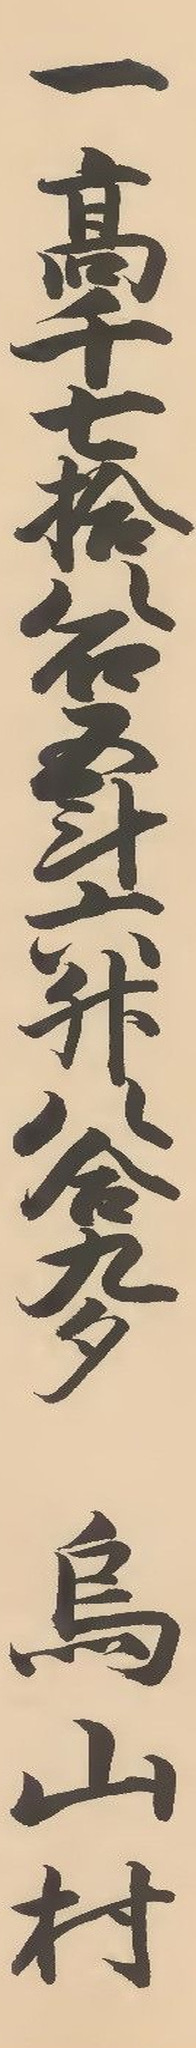一高千七拾八石五斗六升八合九勺烏山村
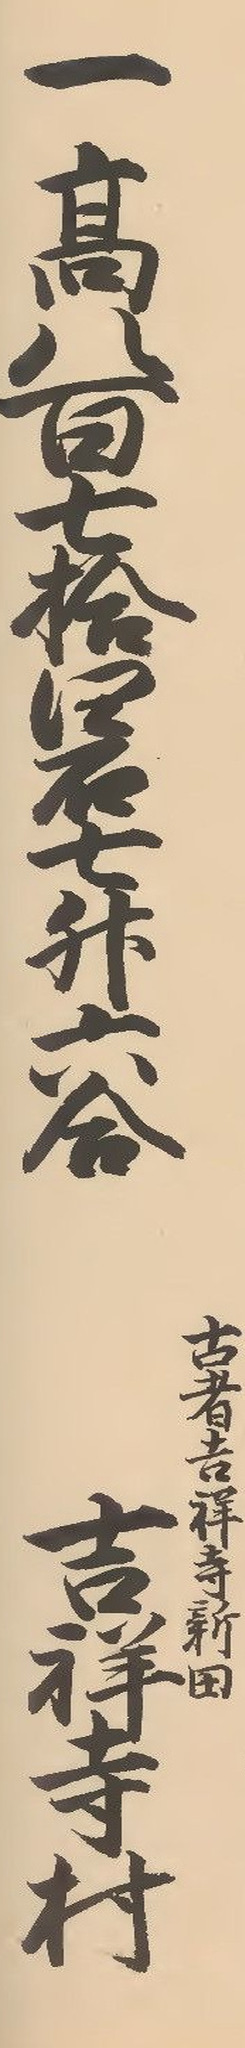一高八百七拾四石七升六合吉祥寺村
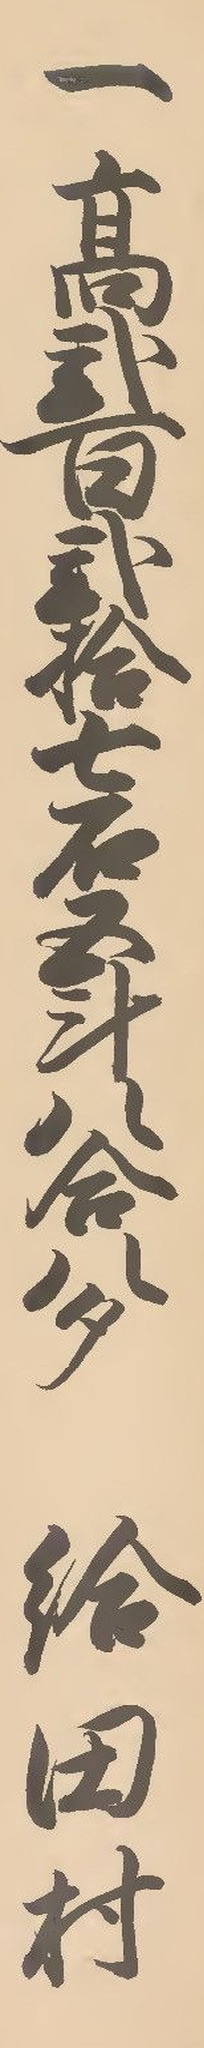一高弐百弐拾七石五斗八合八勺給田村
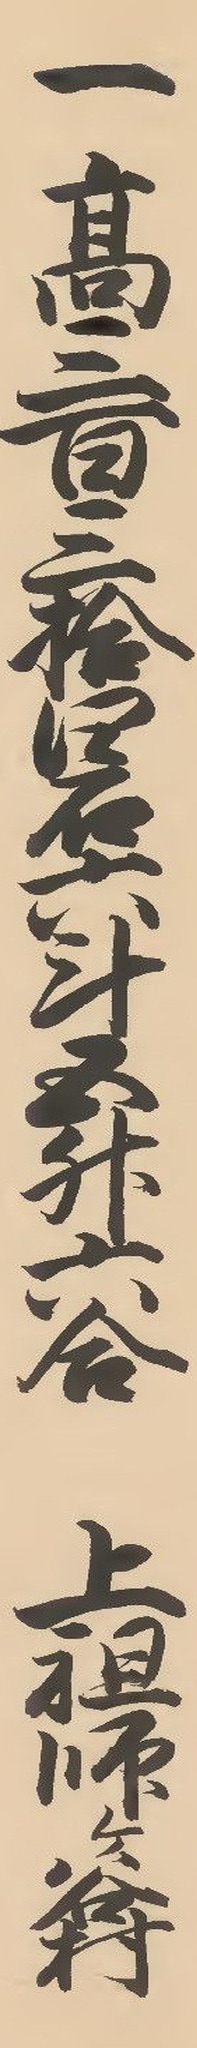一高三百三拾四石六斗五升六合上祖師ヶ谷村
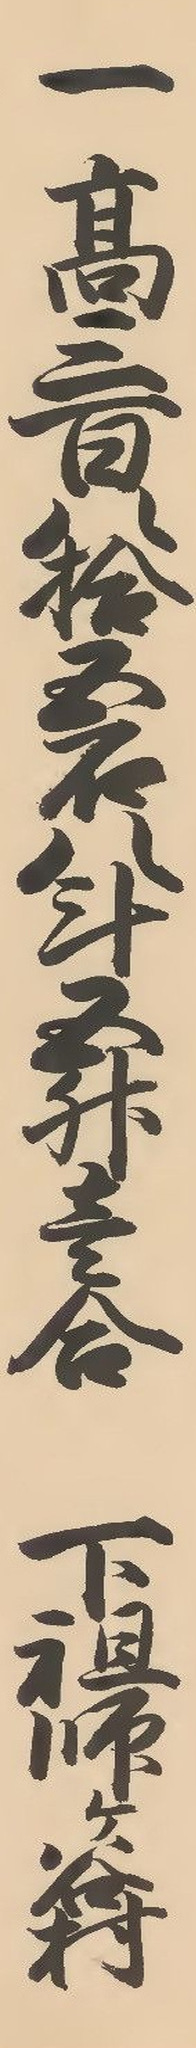一高三百八拾五石八斗五升壱合下祖師ヶ谷村
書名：武蔵国郷帳　上
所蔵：国立公文書館 National Archives of Japan
